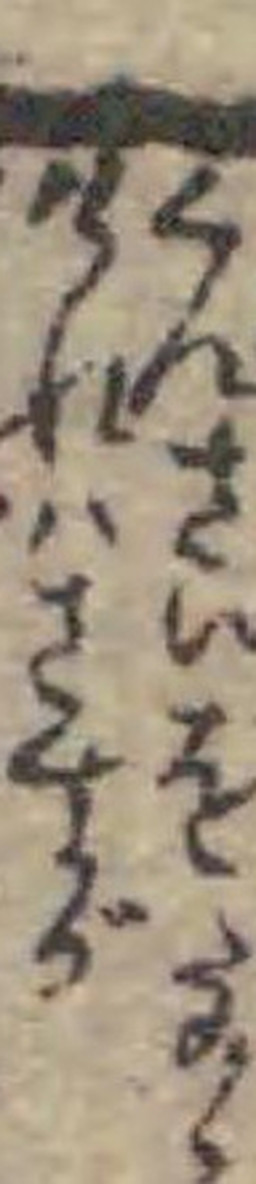けれはさすが
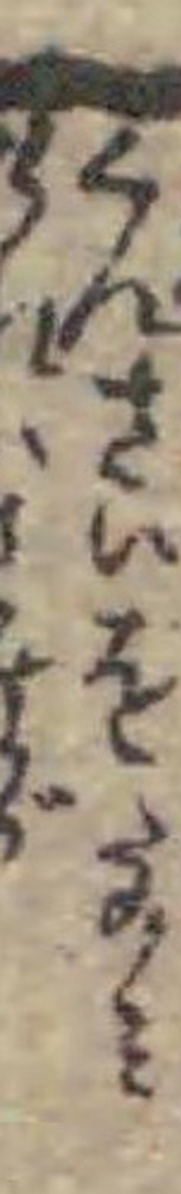くんさいをたのみ
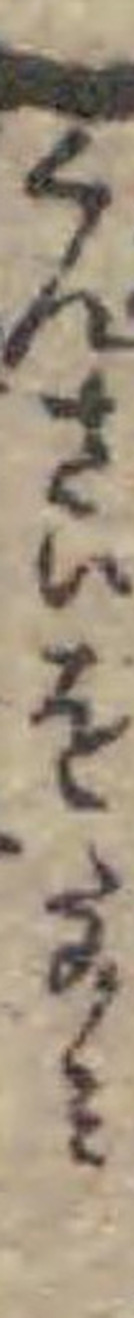くんさいをたのみ
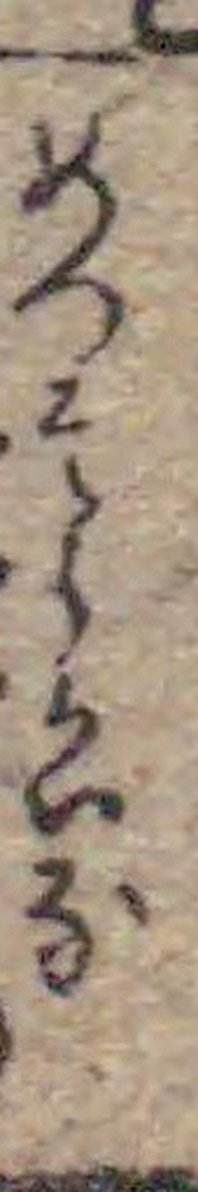めつそうかいな
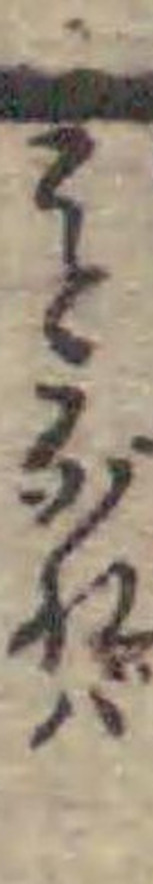ことなれば
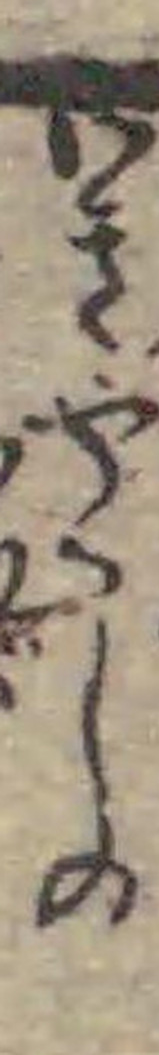はきやくしの
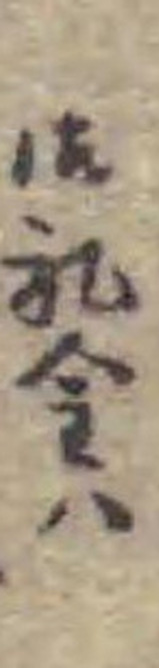御礼金は
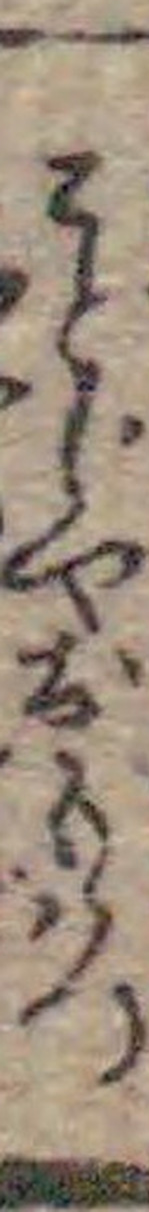ことじやおもはつ
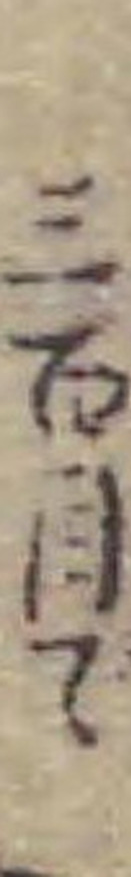三百目で
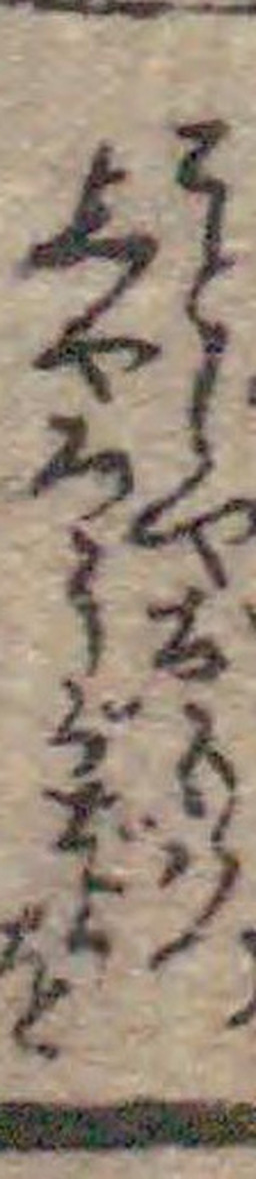しやろうがばかを
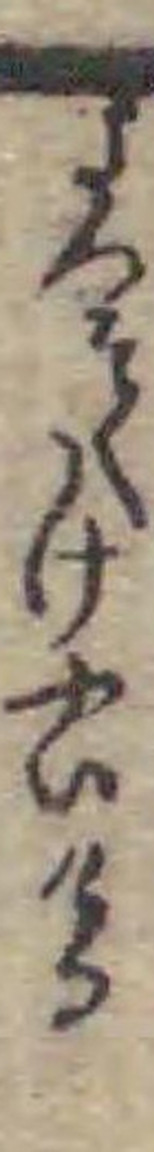さつそくうけやいける
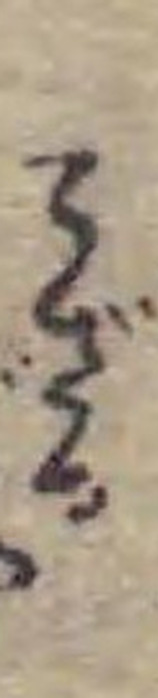こざる
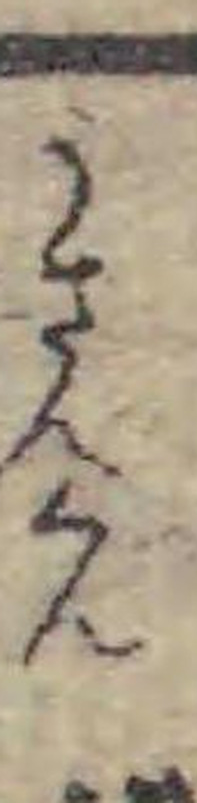うさんくん
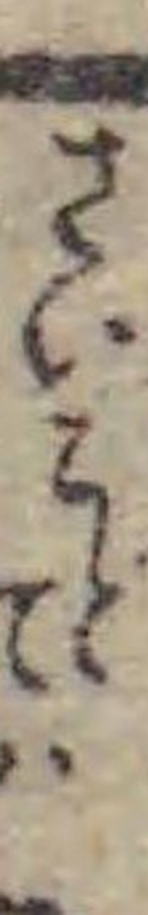さいことては
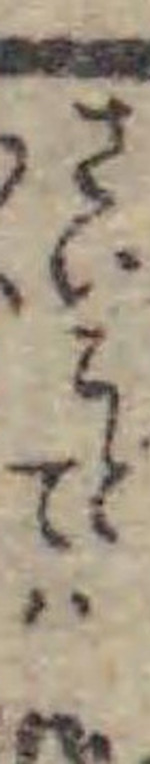さいことては
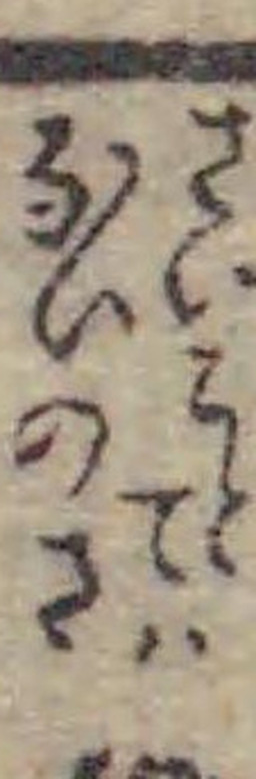ないのさ
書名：江戸花俳優贔屓 : 3巻
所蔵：国立国会図書館 National Diet Library, JAPAN
